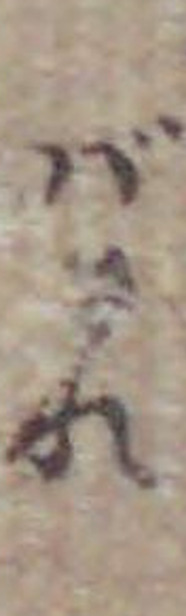ばされ
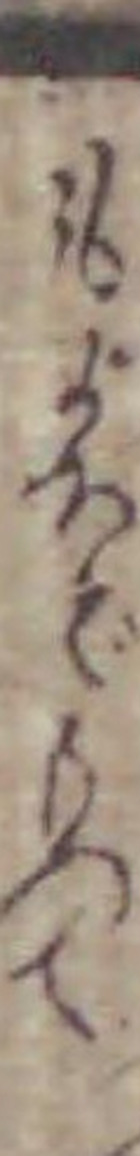もよほどもつて
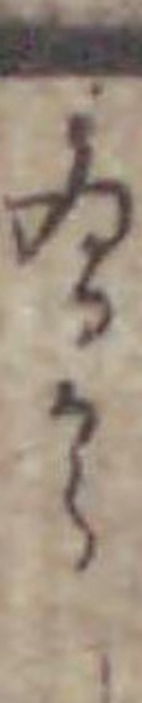ゐるから
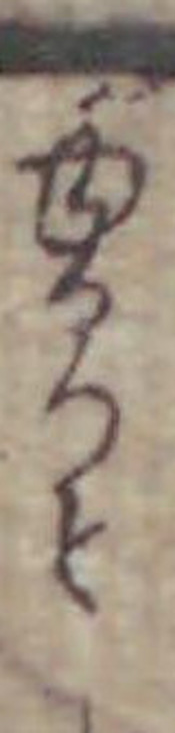ゆるりと
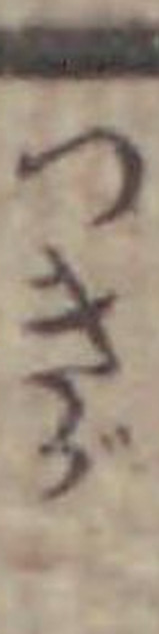つきが
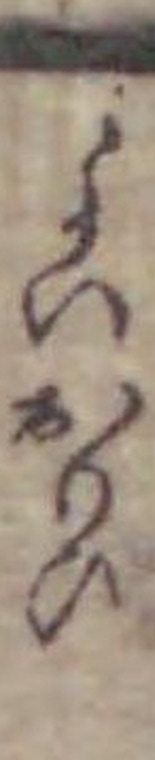よいおもひ
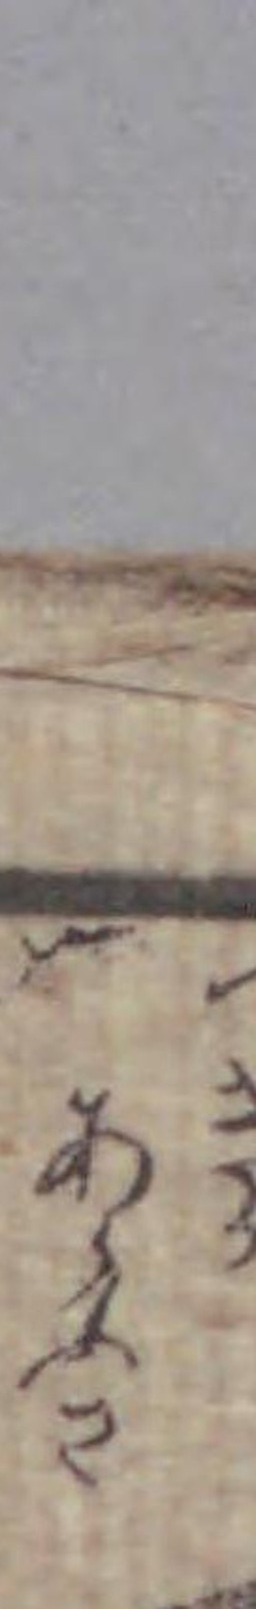あらふさ
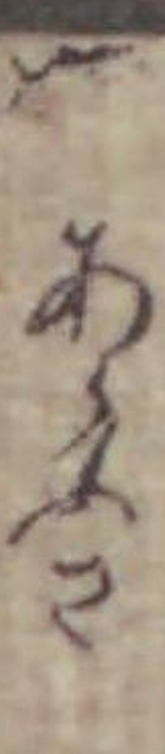あらふさ
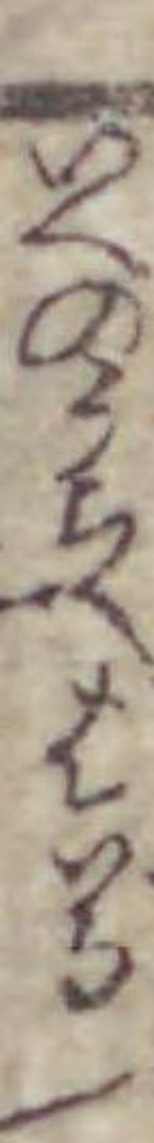いへのうちへはいる
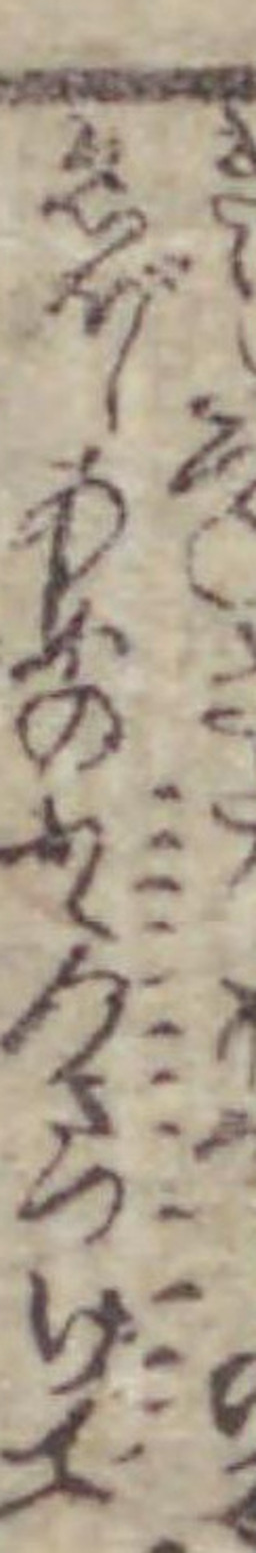ゑぼしあめのふくろさつけて
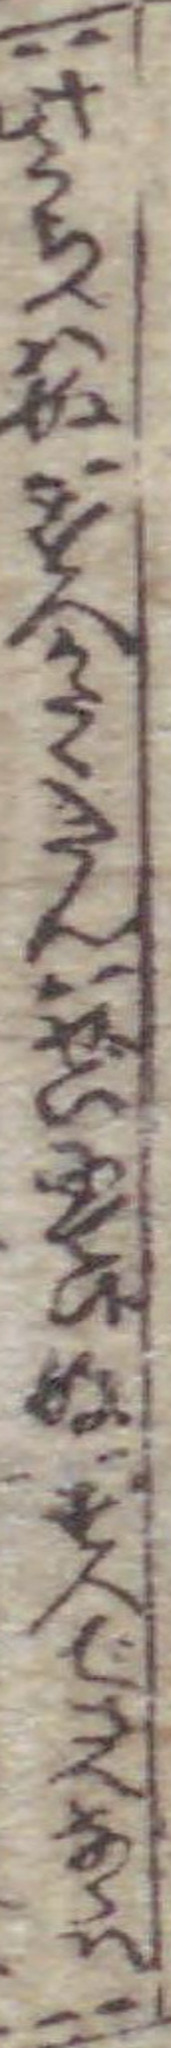此うちへはぬす人かたくきんぜいにて候ぬす人でさへなけは
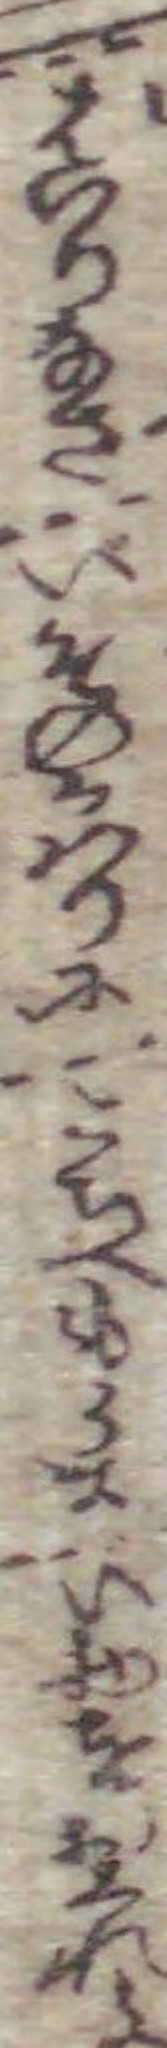はいりなさいそのかはりにこちへもうまい物をおくれよ

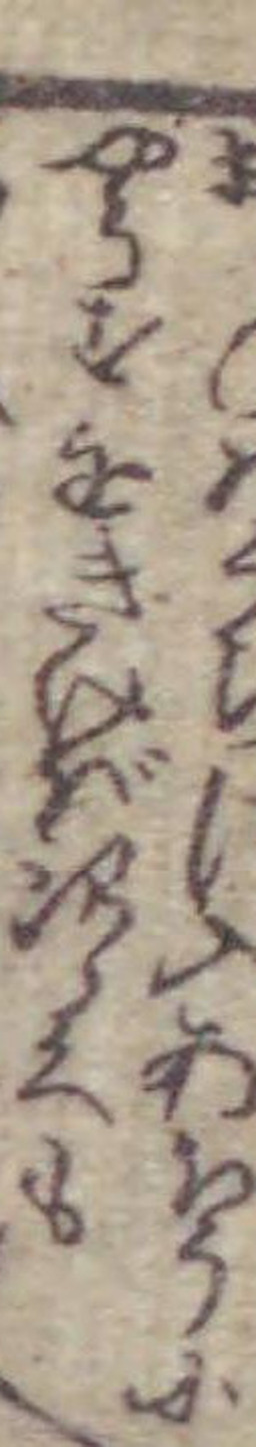やうすをきけば治兵衛も
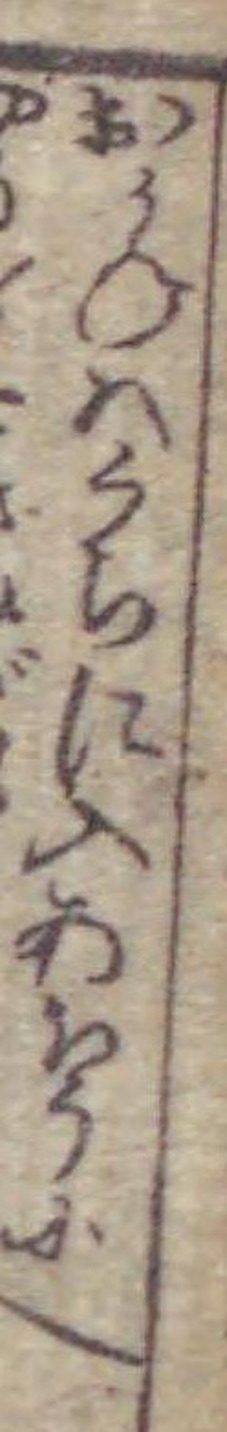おかねはうちに入あほうに
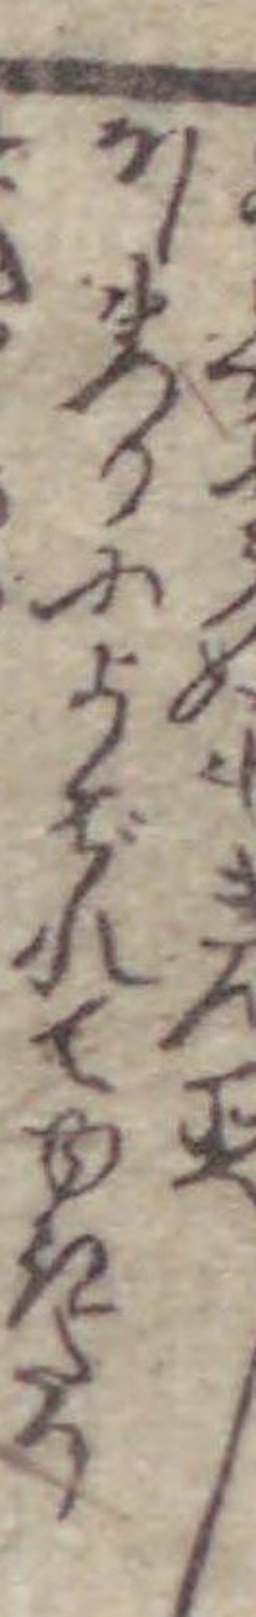ほしまつりによばれてゆきたり
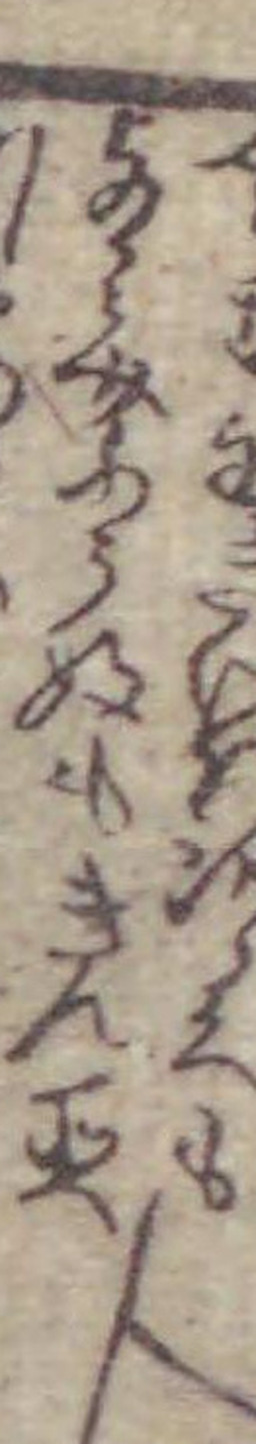与之介ふうふもきん所へ
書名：嗚呼不侭世之助噺 : 3巻
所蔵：国立国会図書館 National Diet Library, JAPAN
